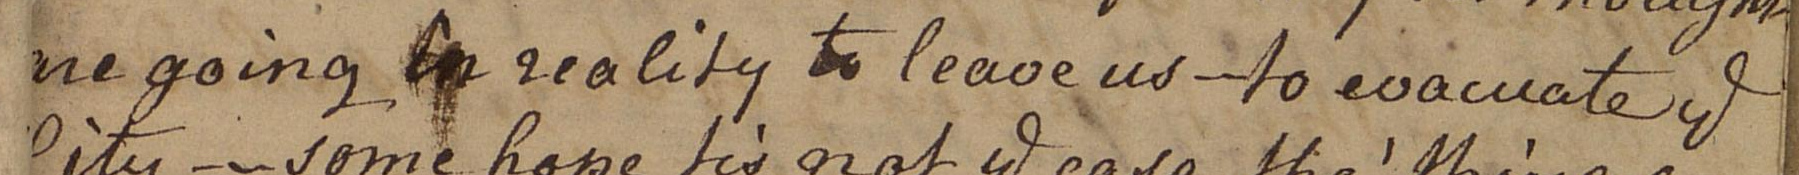me going in reality to leave us- to evacuate y^e
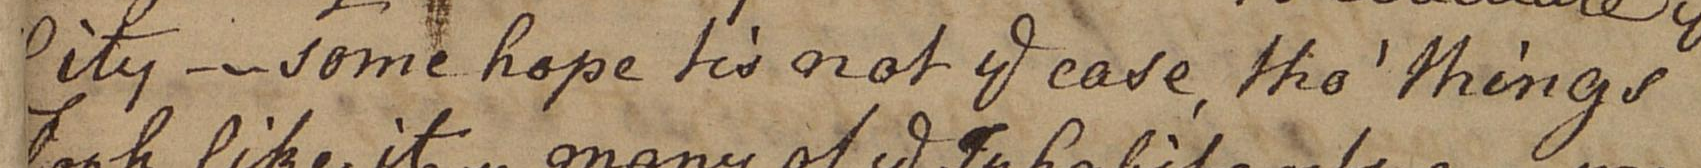City- some hope tis not y^e case, tho' things
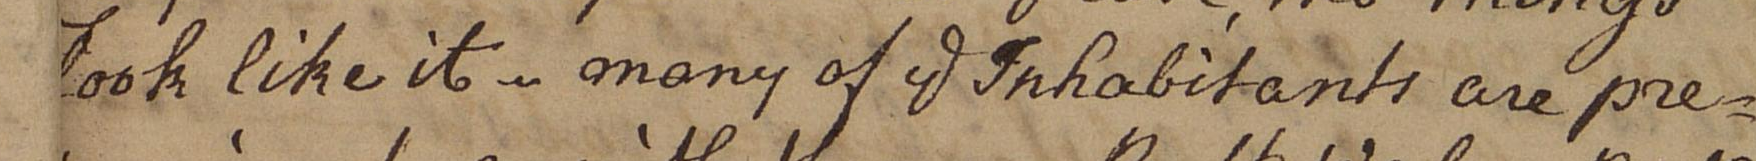look like it- many of y^e Inhabitants are pre-
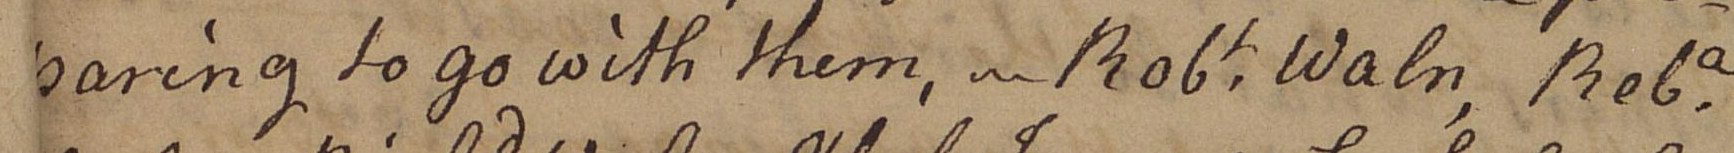paring to go with them, - Rob^t. Waln, Reb^a.
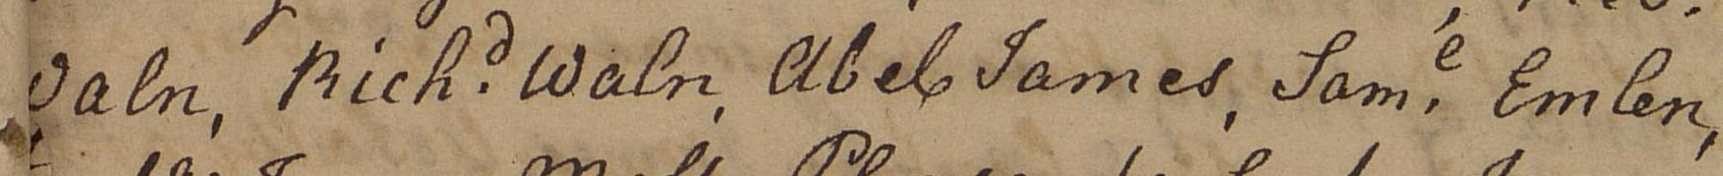Waln, Rich^d Waln, Abel James, Sam^l. Emlen,
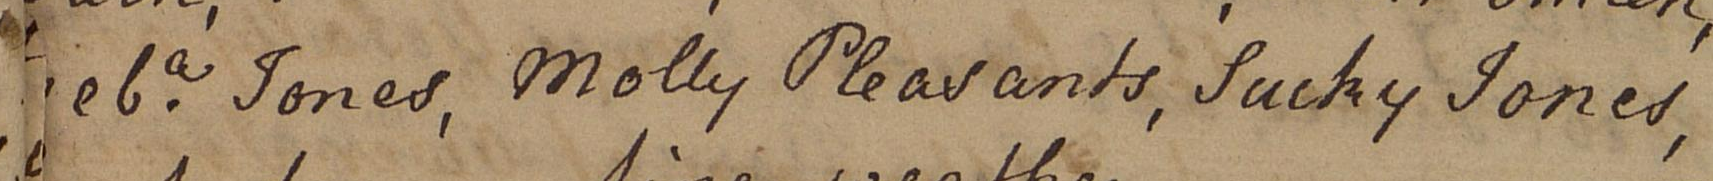[_]eb^a. Jones, Molly Pleasants, Sucky J ones,
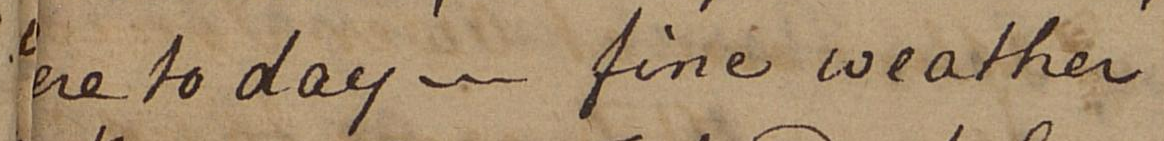ere to day- fine weather
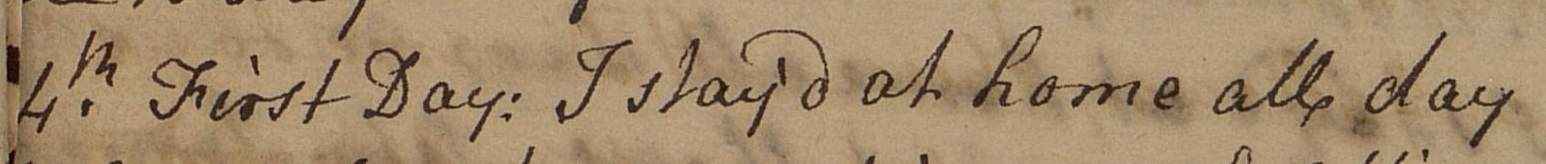4^th. First Day: I stay'd at home all day
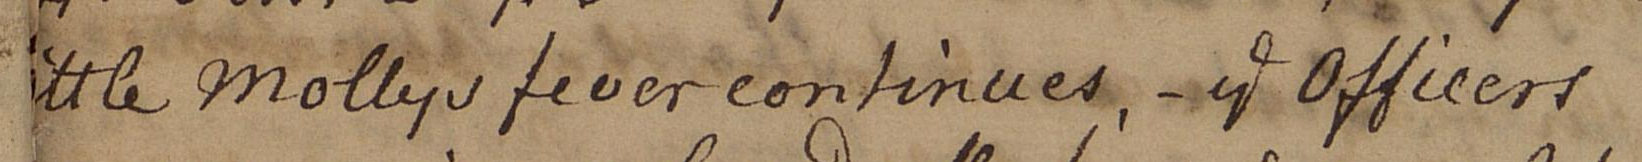ittle mollys fever continues,- y^e Officers
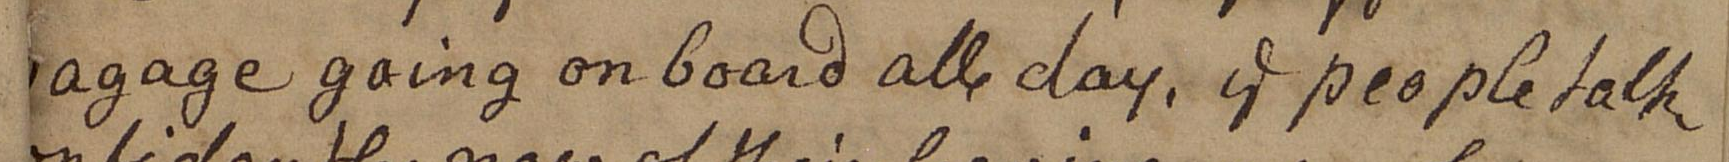agage going on board all day, y^e people talk
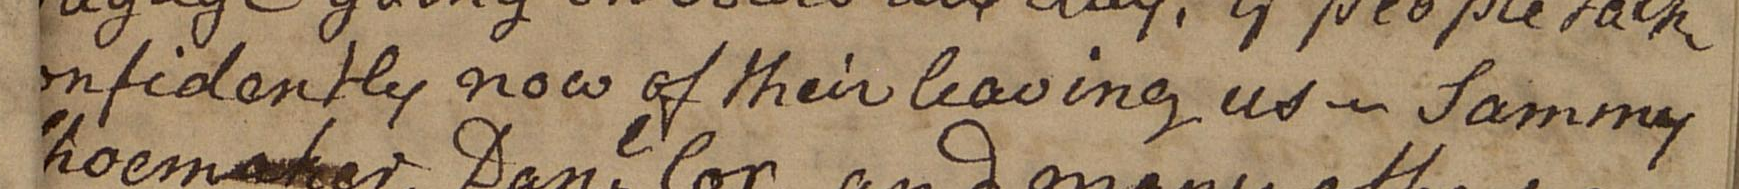onfidently now of their leaving us- Sammy
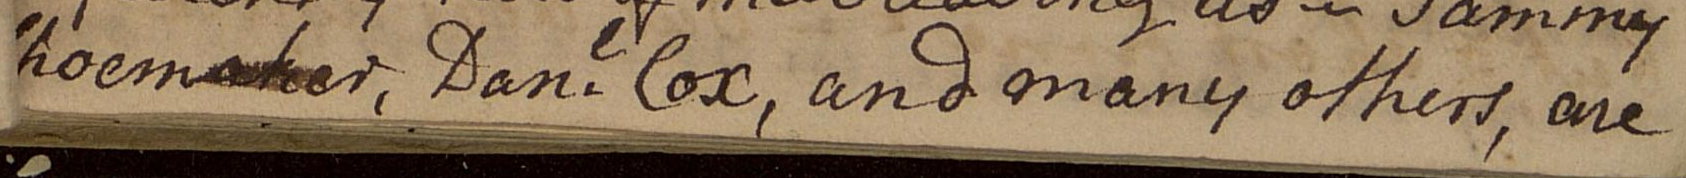Showmaker, Dan^l. Cox, and many others, are
